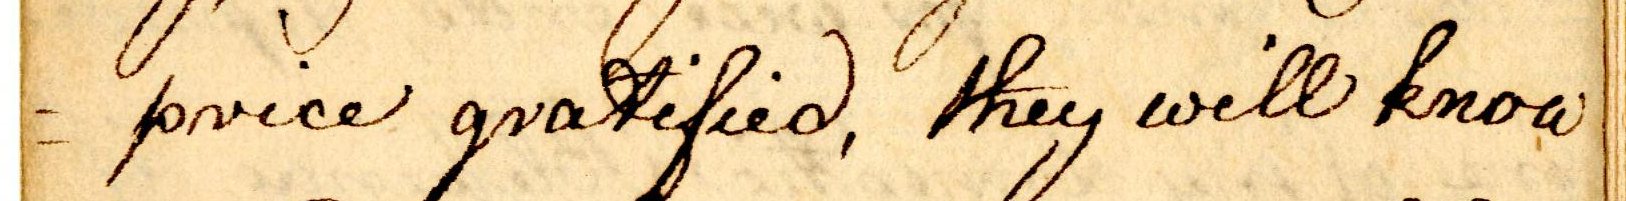-price gratified, they will know
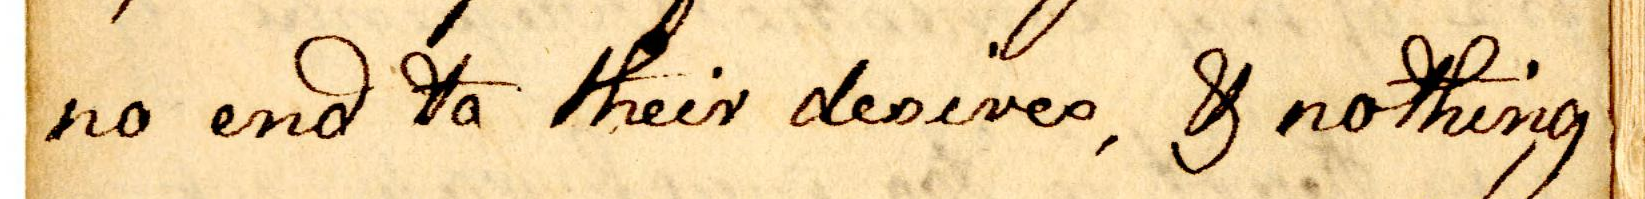no end to their desires, & nothing
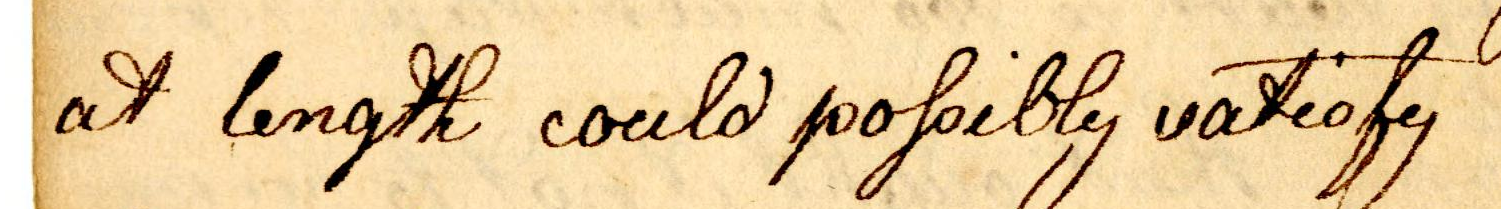at length could possibly satisfy
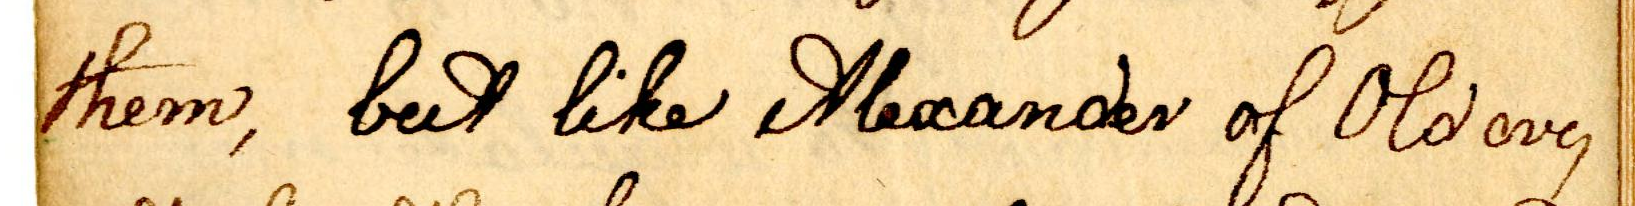them, but like Alexander of Old cry
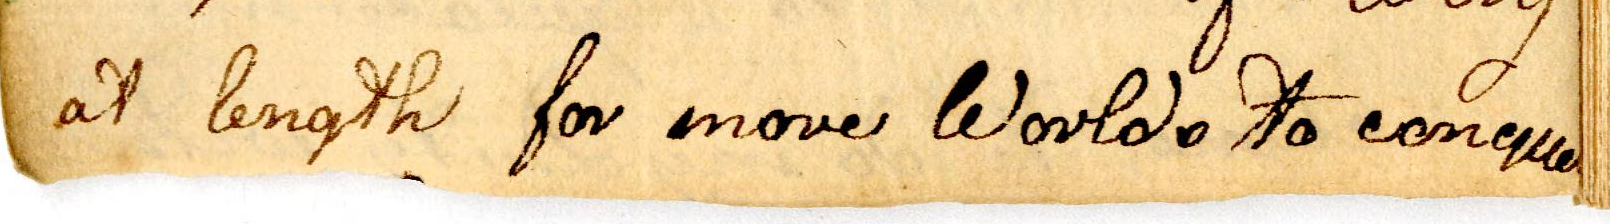at length for more Worlds to conque
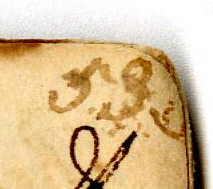53
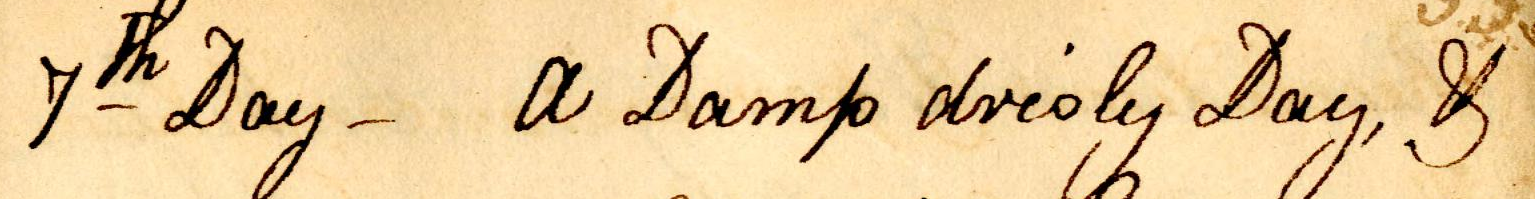7^th Day- A Damp drisly Day, &
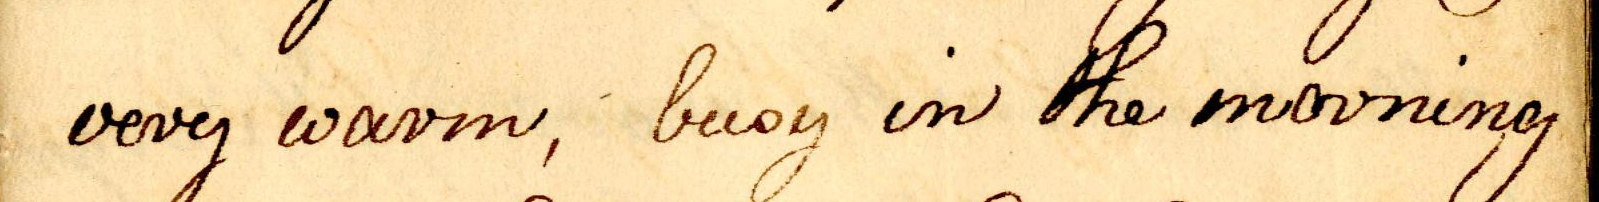very warm, busy in the morning
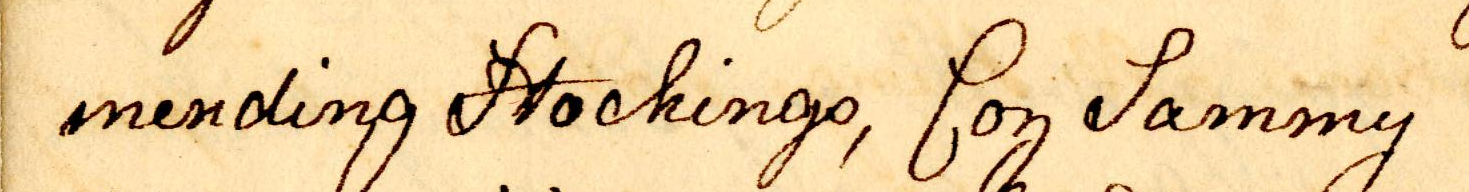mending Stockings, Coz Sammy
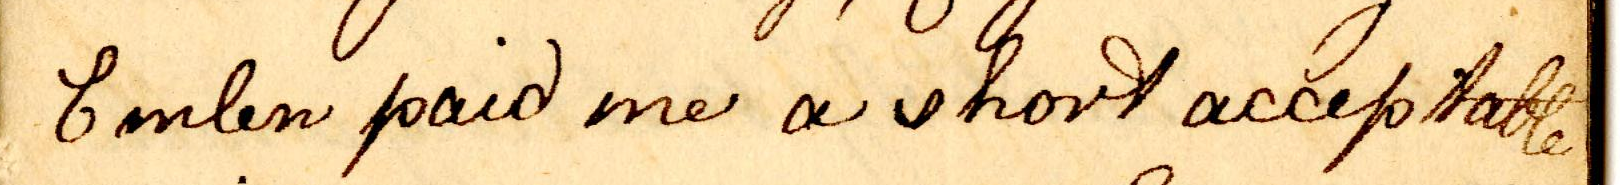Emlen paid me a short acceptable
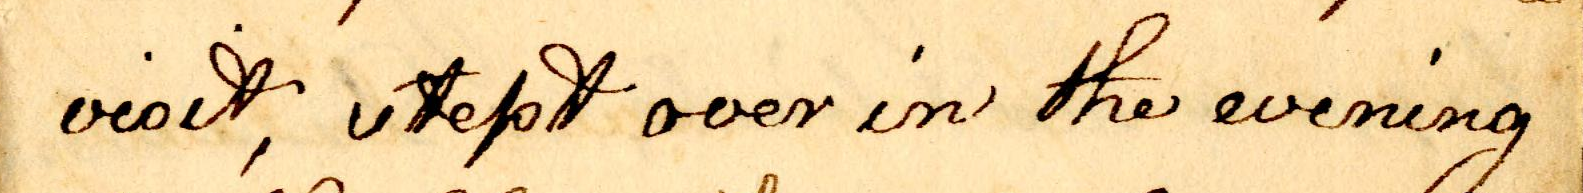visit, stept over in the evening
